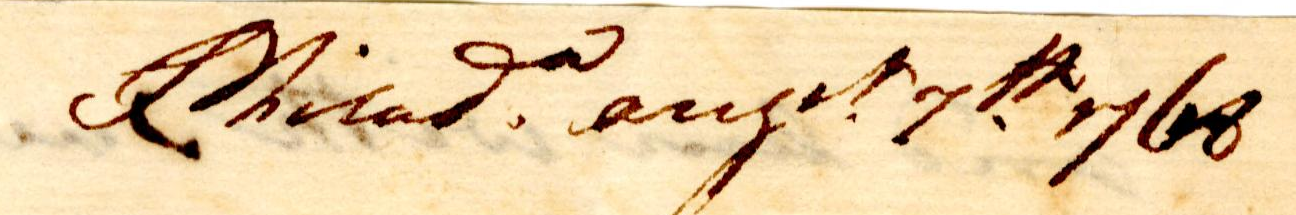Philad^a. aug^t. 7^th. 1768
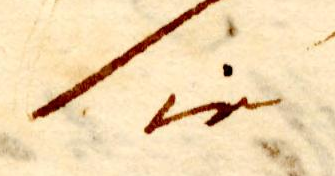Sir
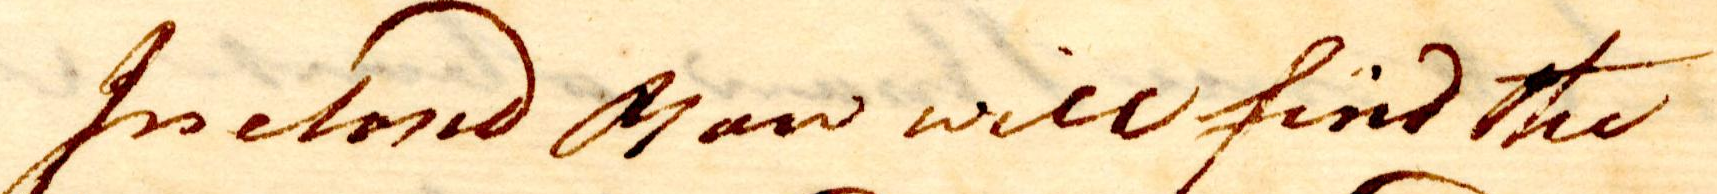Inclosed you will find the
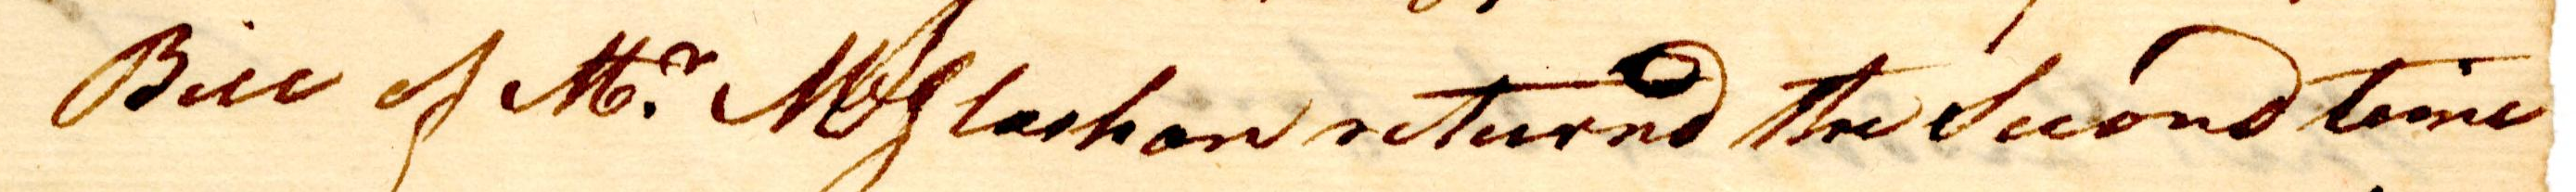Bill of M^r. McGlashon returnd the Second time
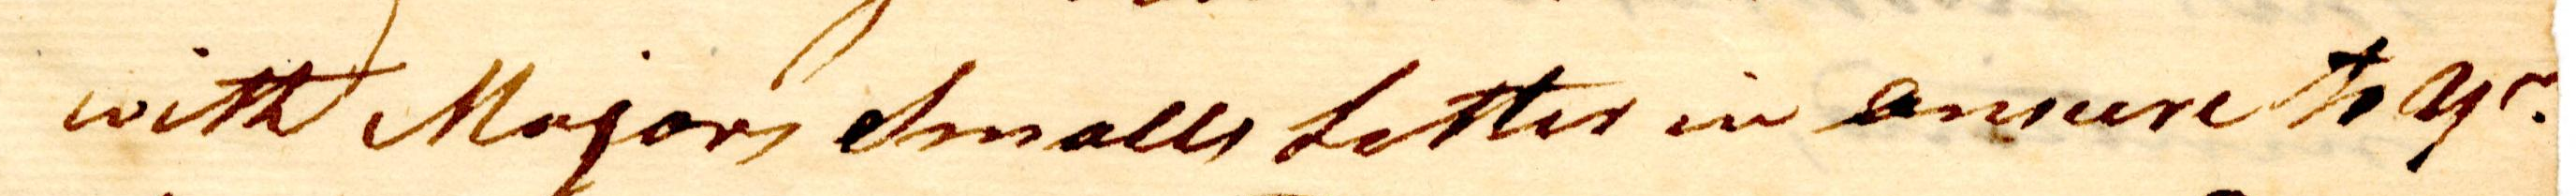with Majors Smalls Letter in ansure to y^r.
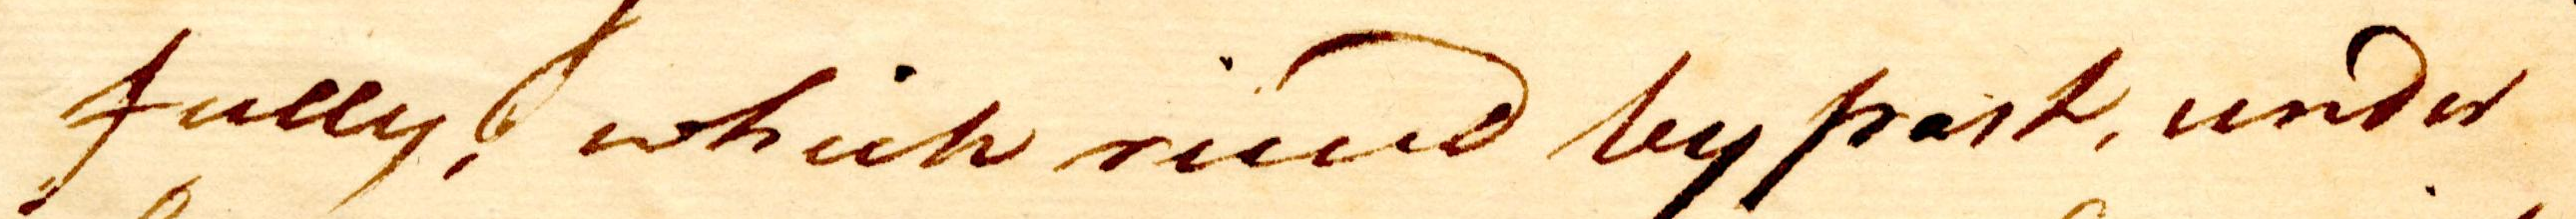fully; which recevd by post, under
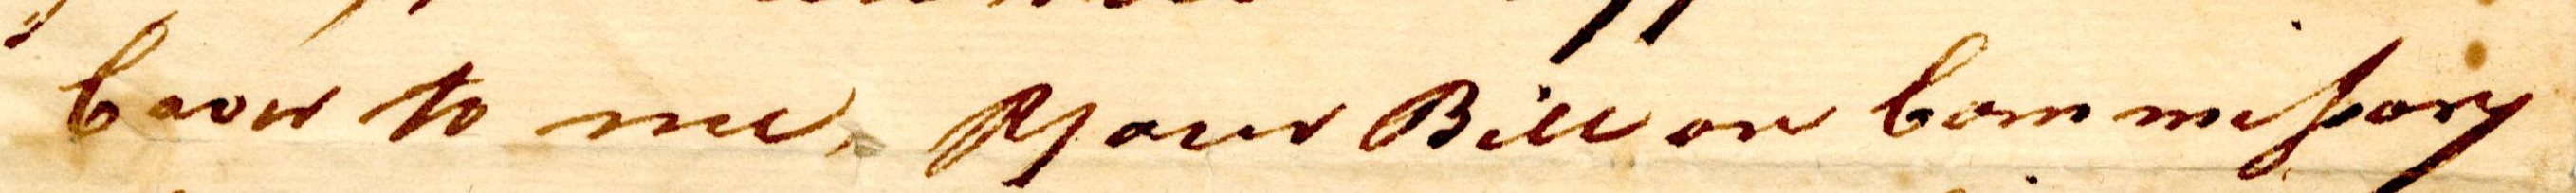Cover to me your Bill on Commissory
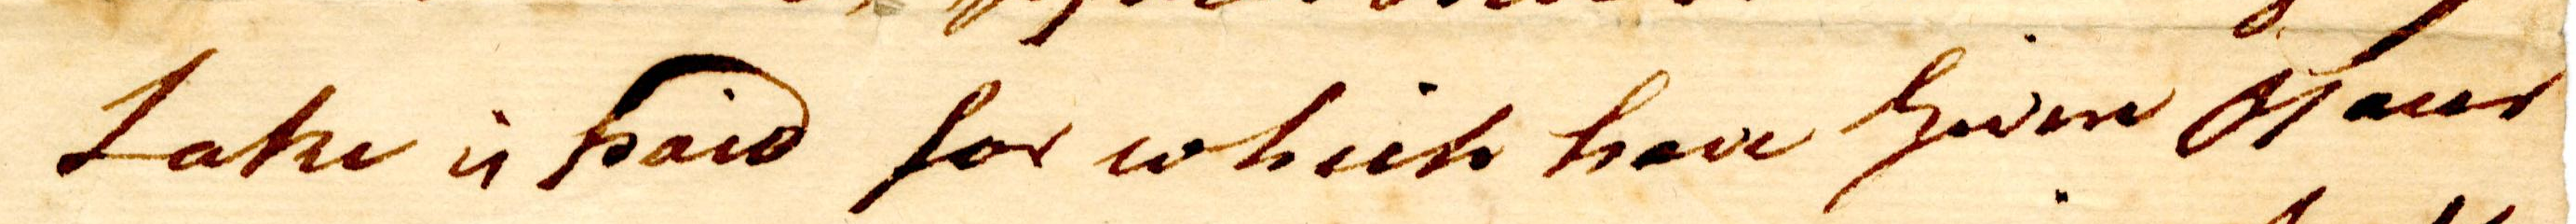Lake is paid for which have Given your
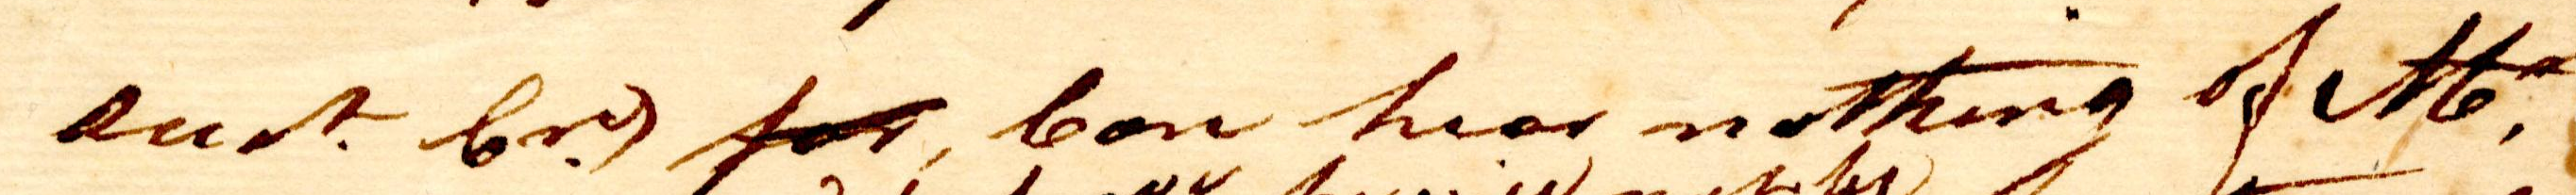secr^t. Cr^y. [for] Can hear nothing of M^r
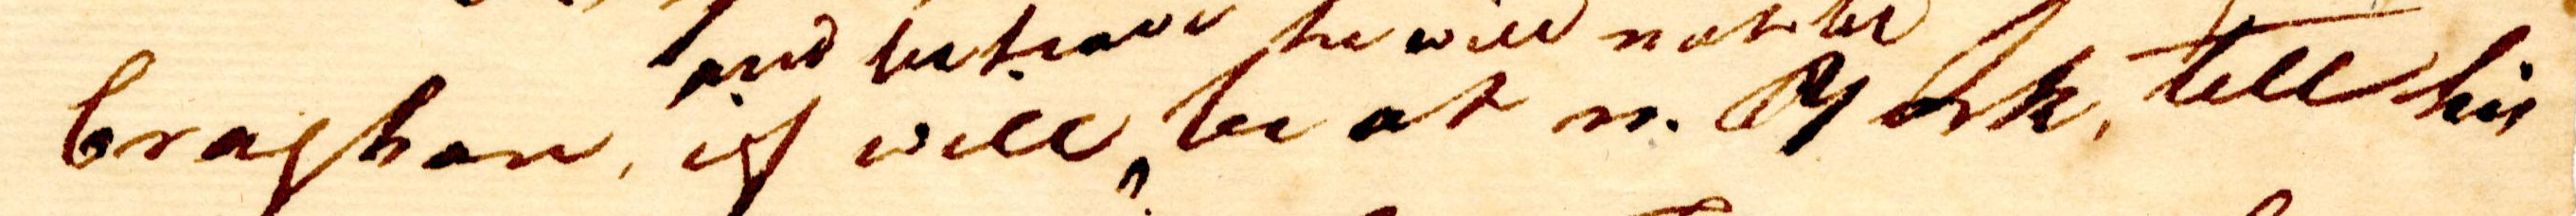Craghan, if will ^ be at n. York, tell his
